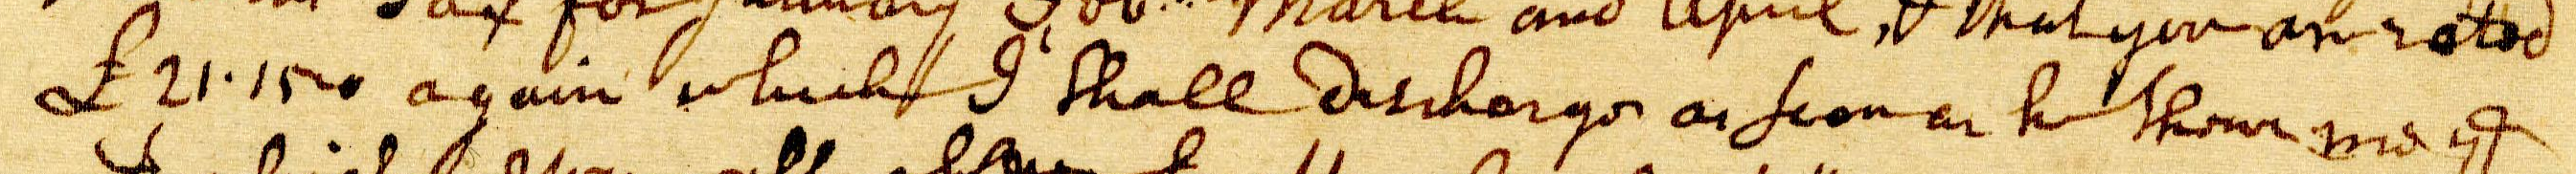£21/150 again which I shall discharge as soon as she shews me y^e
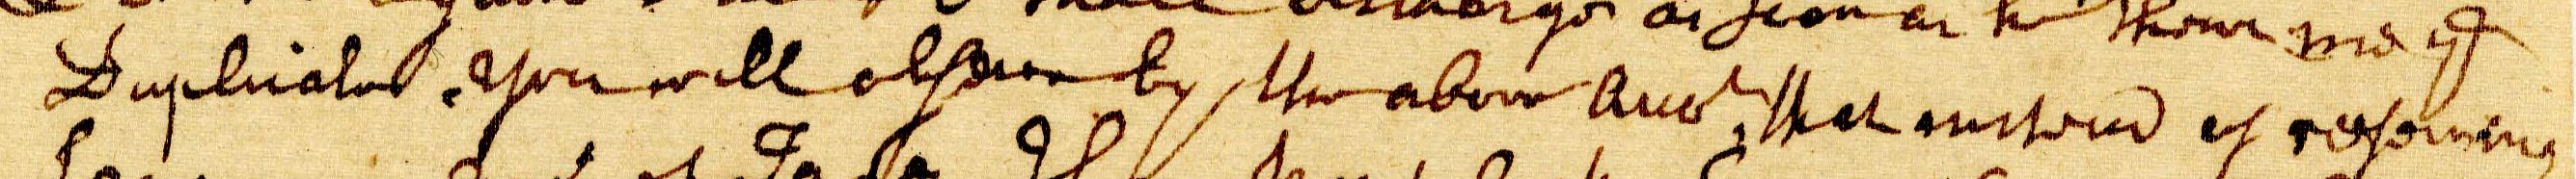Duplicate. You will observe by the above Acco^t. that instead of referring
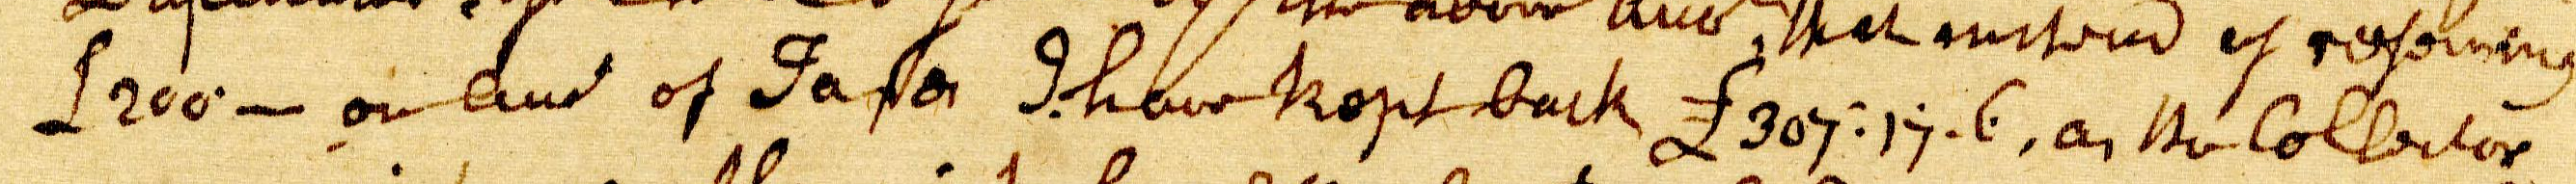£200- on Acco^t of Taxes I have kept back £307:17.6, as the Collector
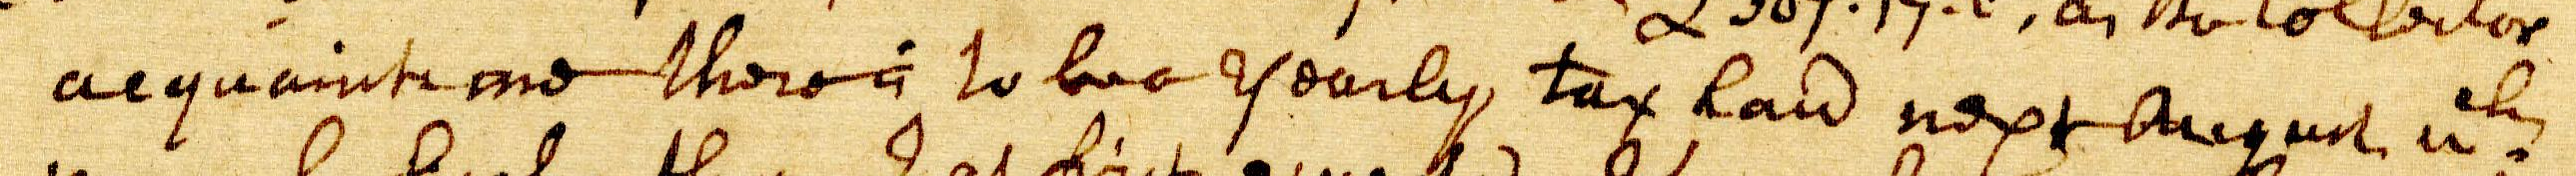acquaints me- there is to be a Yearly tax laid next August w^ch.
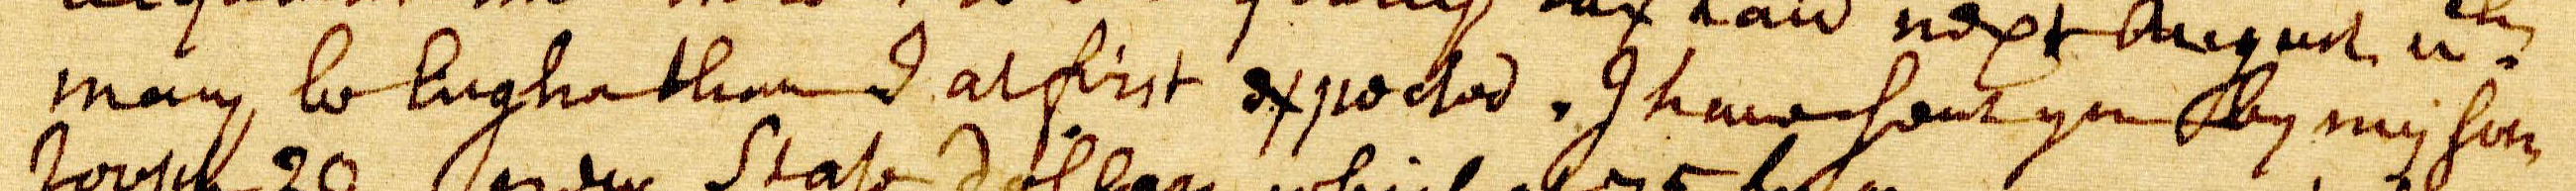May be lighter than I at first expected. I have sent you by my Son,
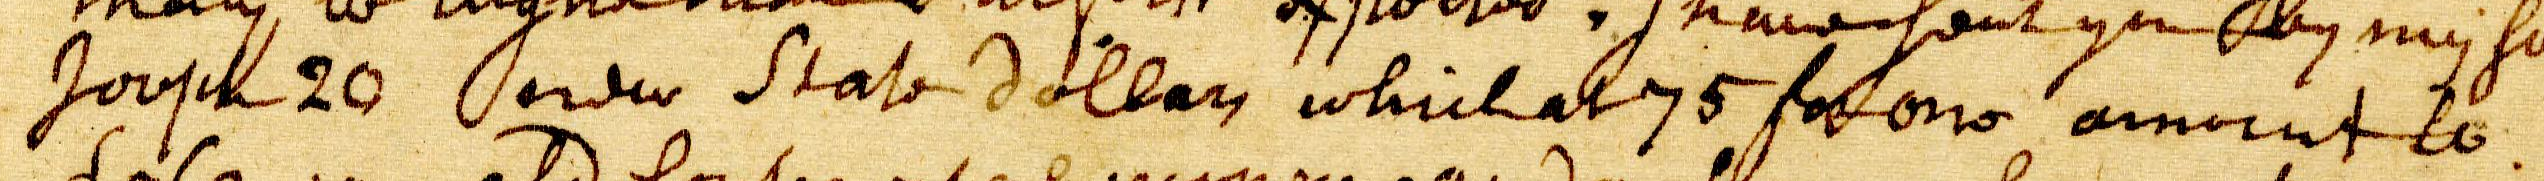Joseph 20 new State dollars which at 75 for one amount to
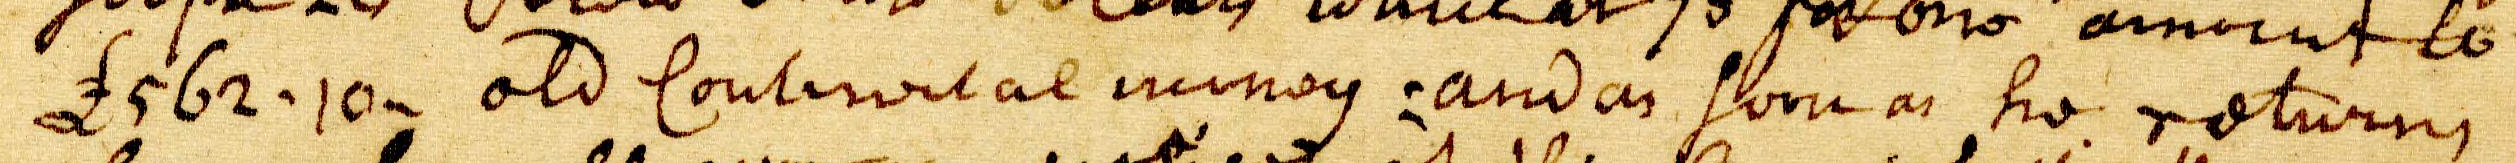£562.10,, old Continental money: and as soon as he returns
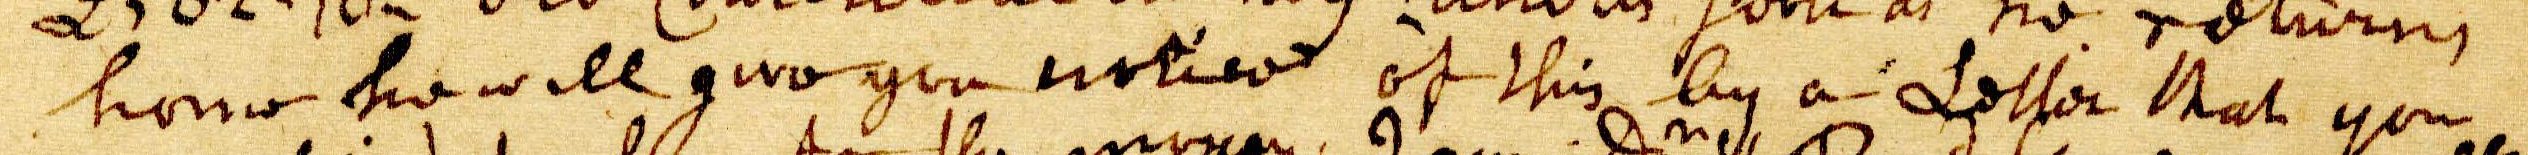home he will give you notice of this by a Letter that you
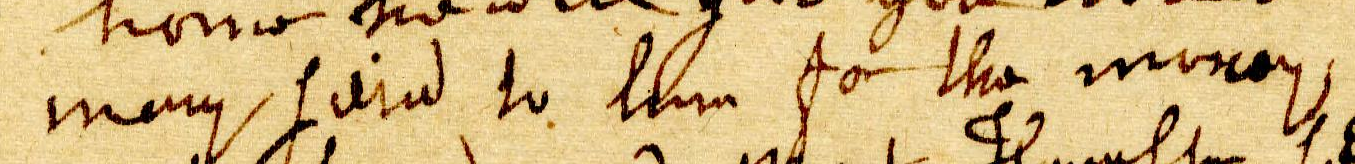may send to him for the money
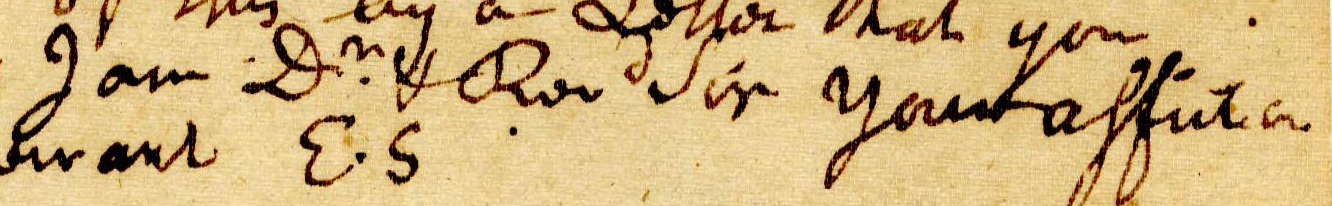I am D^r. & Rec^d Sir Your affection
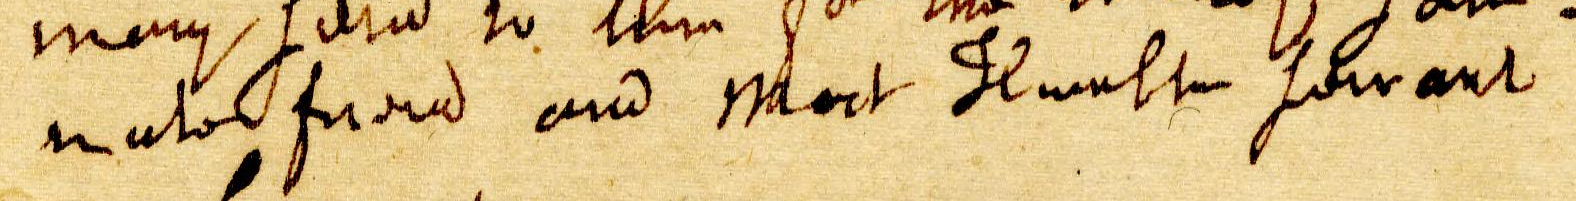nate friend and Most Humble Servant
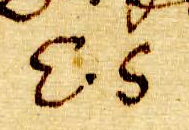E.S
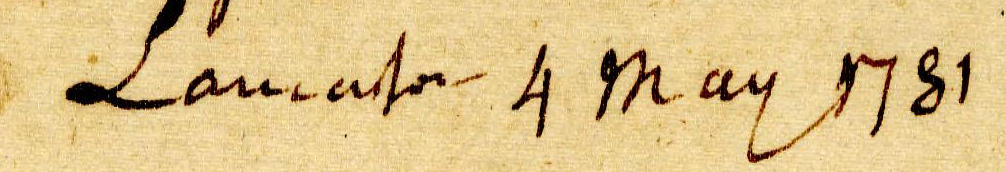Lancaster 4 May 1781
